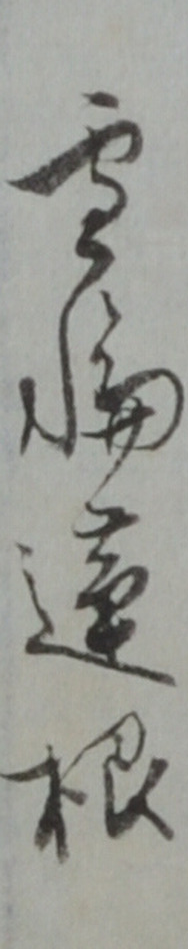雪輪蓮根
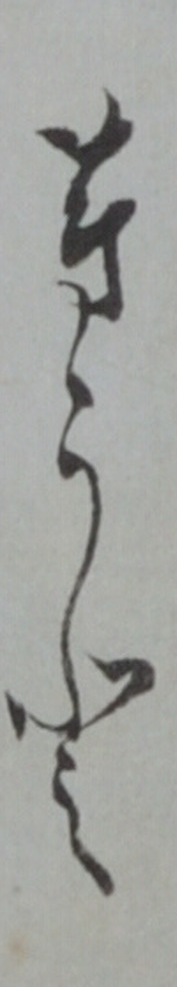芽うと
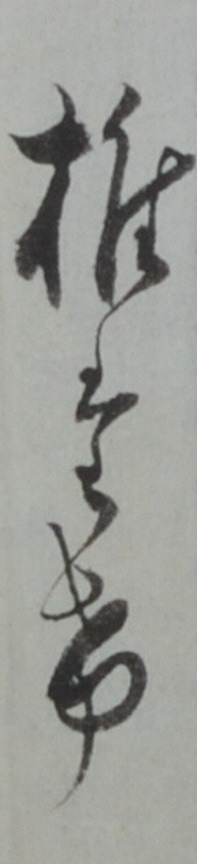椎たけ

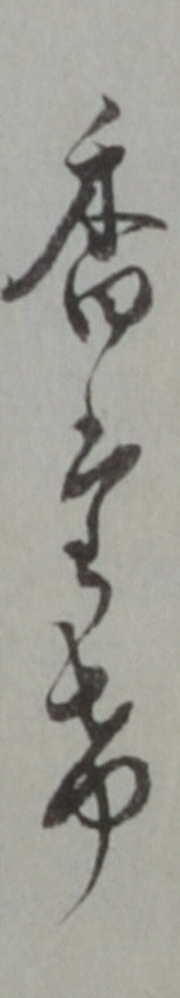香たけ
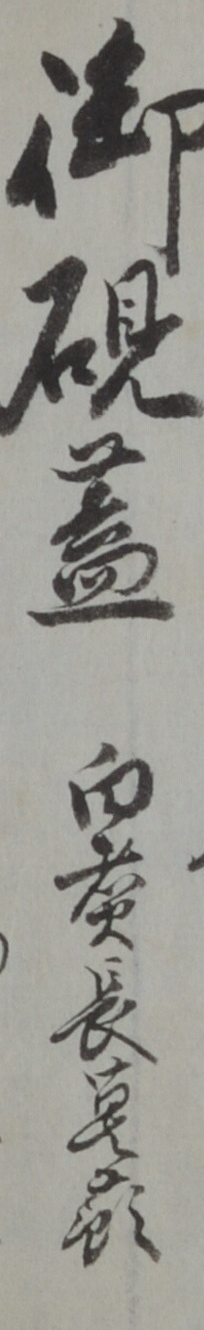御硯蓋白煮長薯蕷
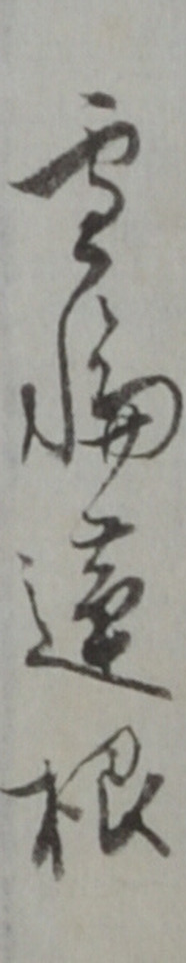雪輪蓮根
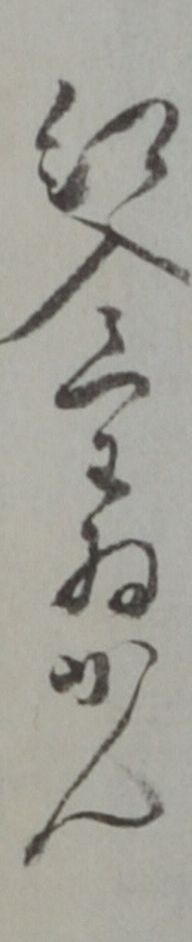紅入壱ゐかん
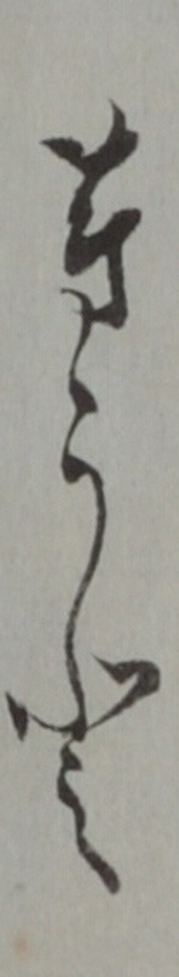芽うと
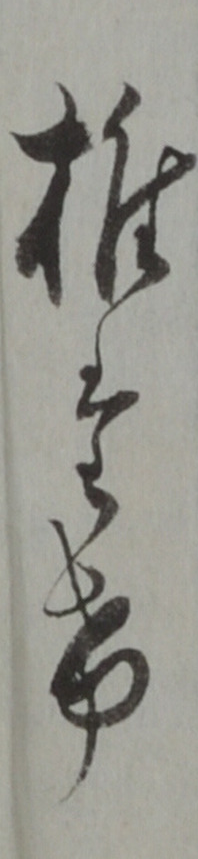香たけ
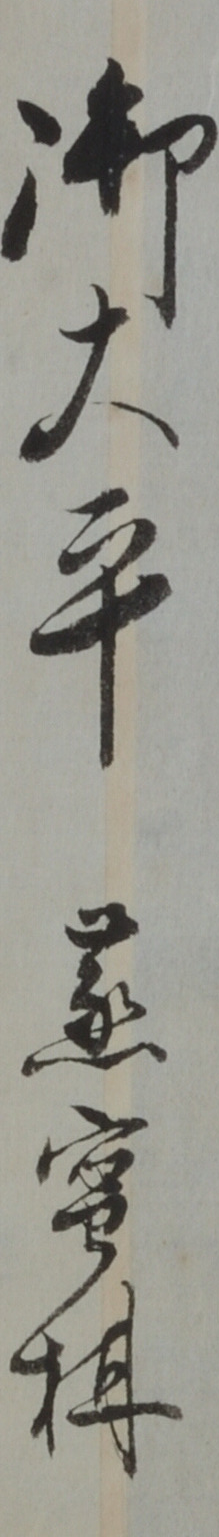御大平蒸蜜柑
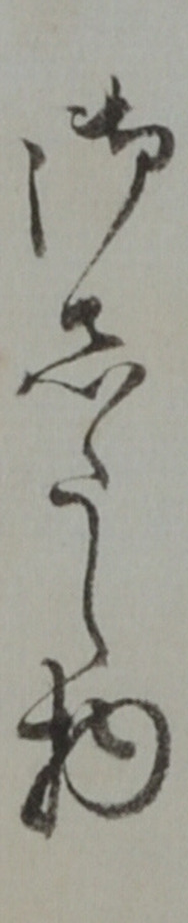御したし物
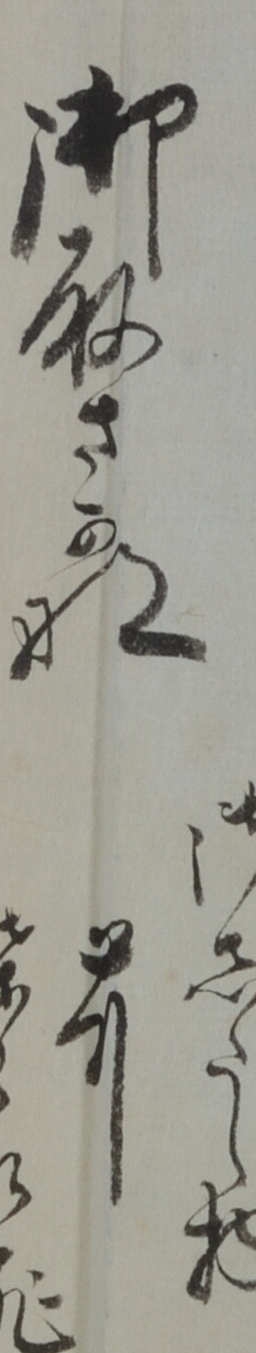御取りさかな芹
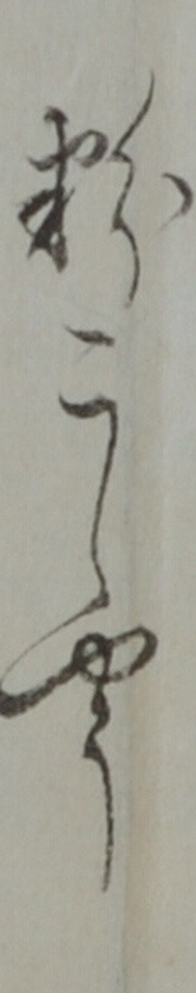粉こしやう
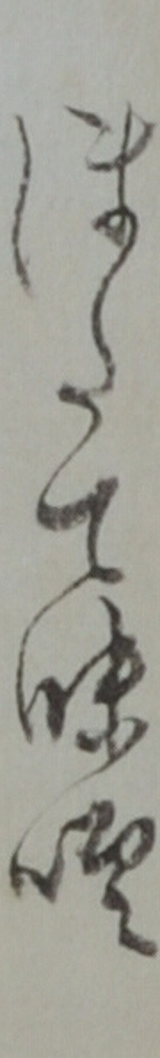ほたて味噌
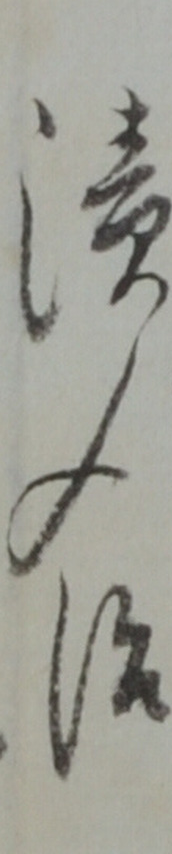漬〆じ
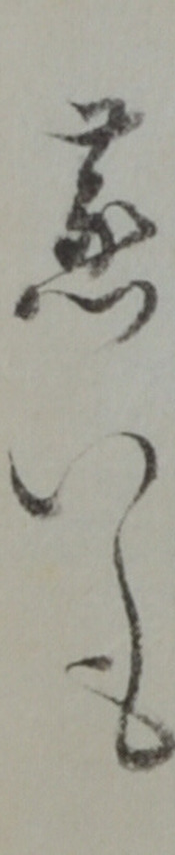蒸いも
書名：献立書上
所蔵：伊那市立高遠町図書館・合同会社AMANE
